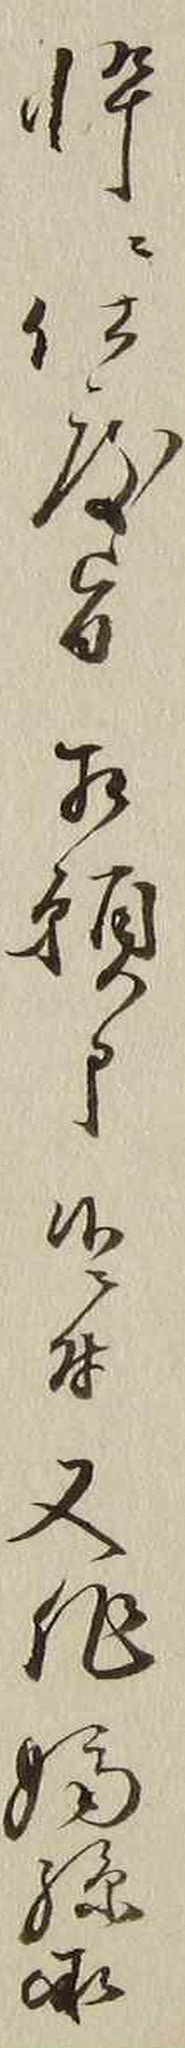忰ニ仕度旨相願申候ニ付又作嫡孫承
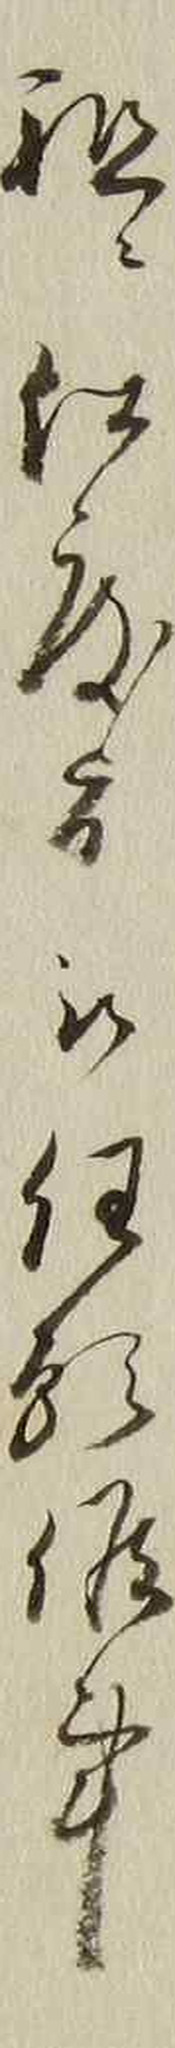祖ニ仕度旨被任願候事
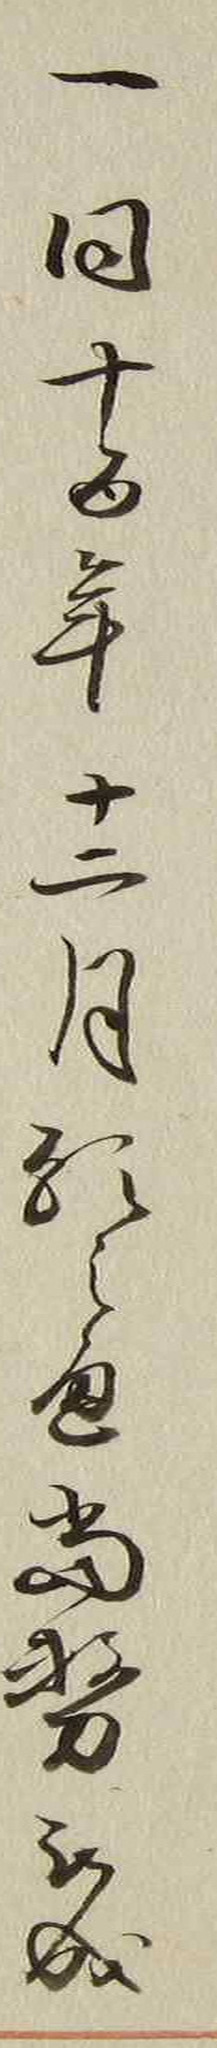一同十酉年十二月願之通当務被成
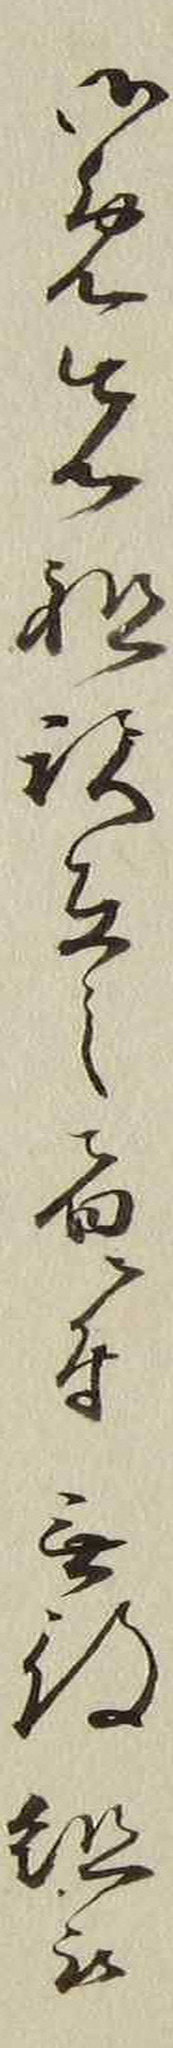御免先祖訳在之者ニ付無役組被
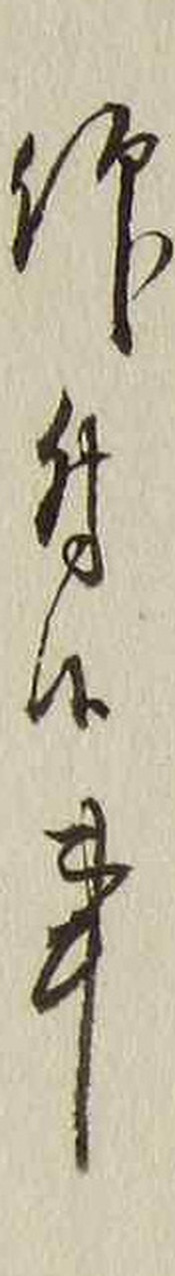仰付候事
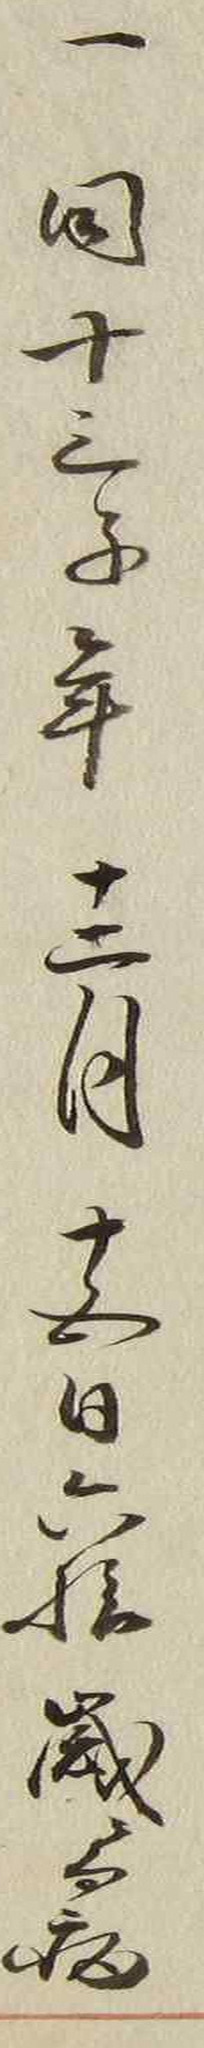一同十三子年十二月十五日六拾歳ニ而病
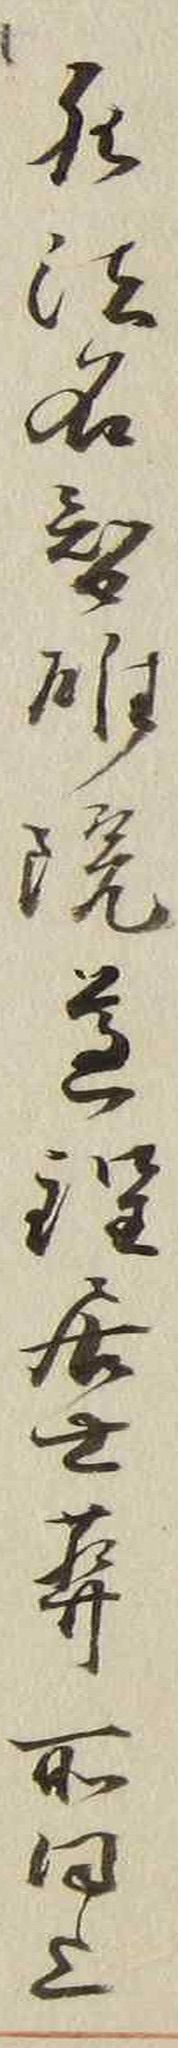死法名智碓院道程居士葬所同上

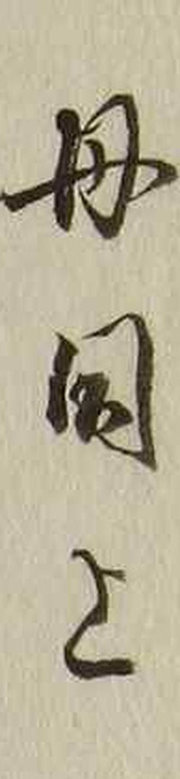母同上
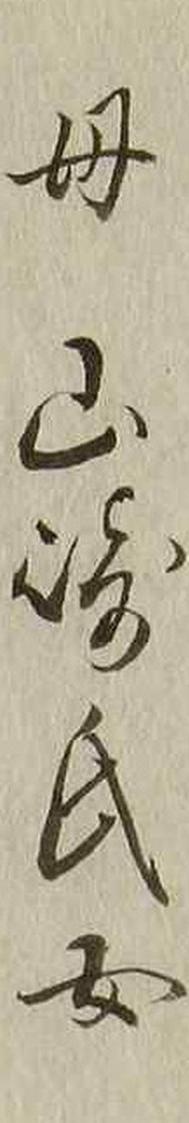母山崎氏女
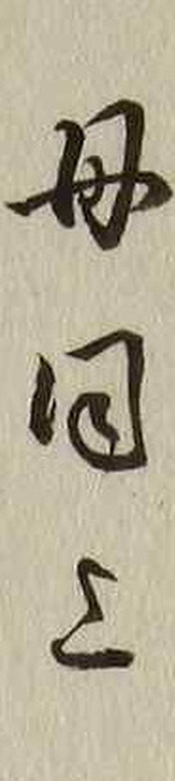母同上
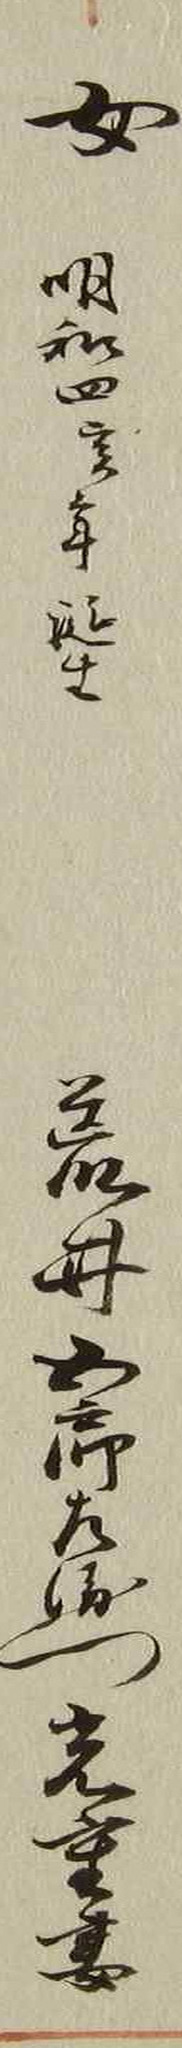女明和四亥年誕生荒井五郎左衛門光重妻
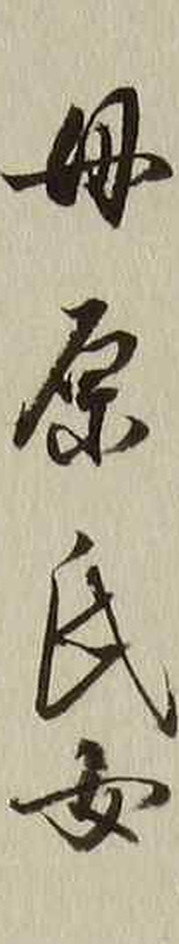母原氏女
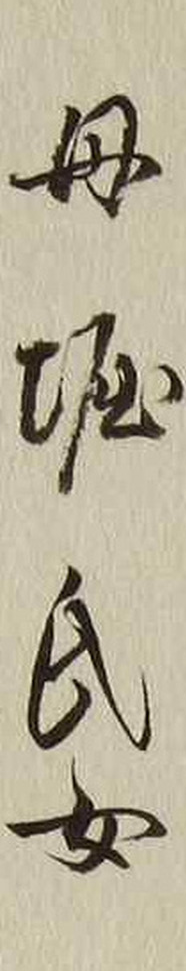母堀氏女
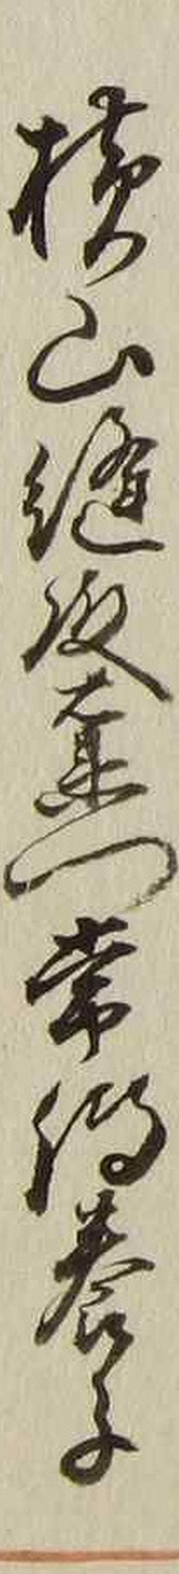横山縫殿右衛門常伝養子
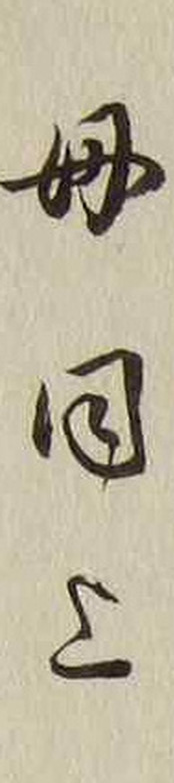母同上

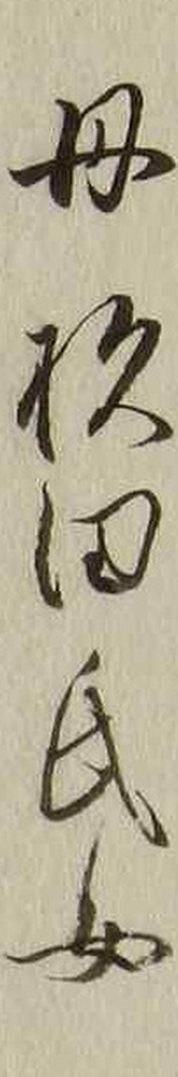母杉田氏女
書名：諸士系譜　巻之122　よ之部5
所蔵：会津若松市立会津図書館
